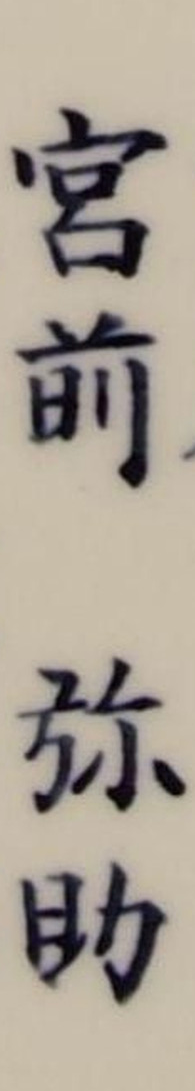宮前弥助
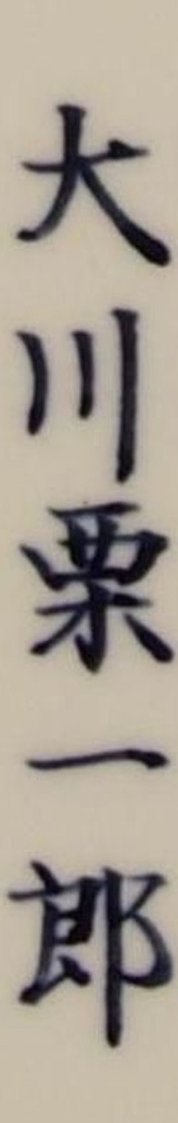大川栗一郎
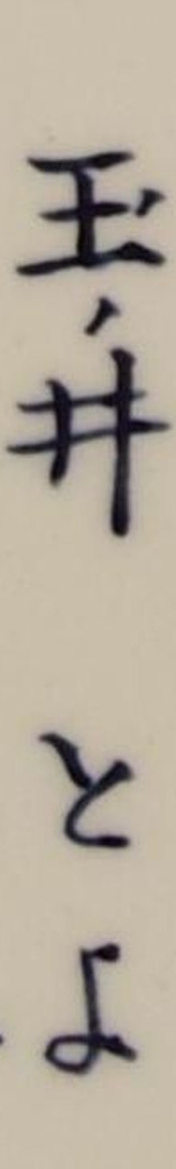玉ノ井とよ
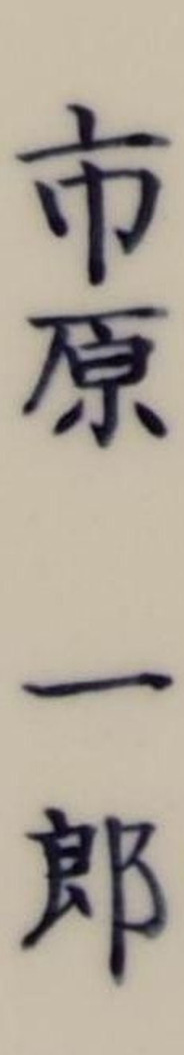市原一郎
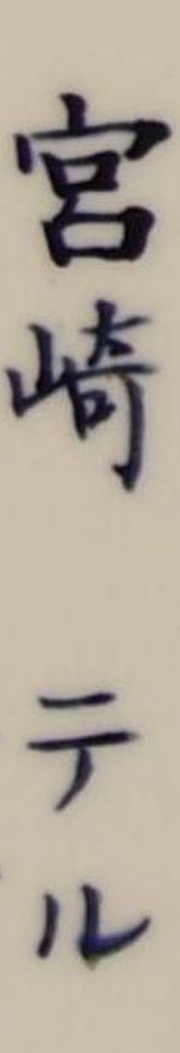宮崎テル
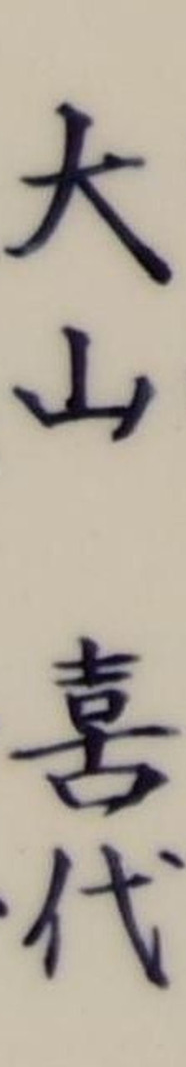大山喜代
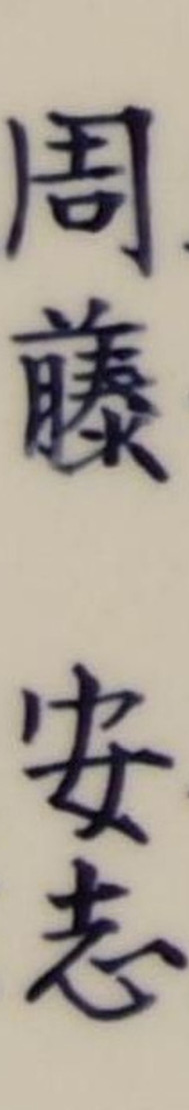周藤安志
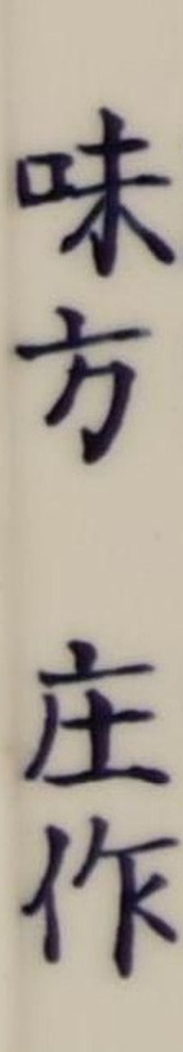味方庄作

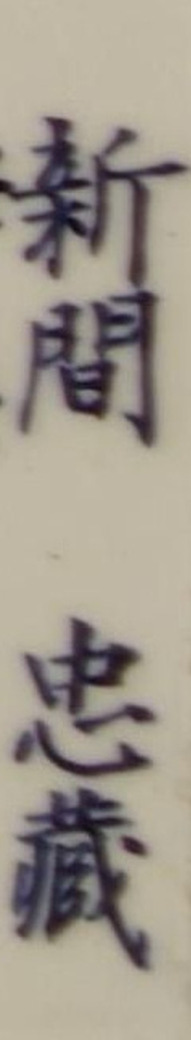新間忠蔵
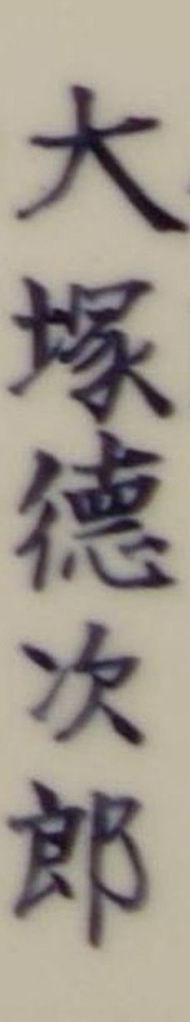大塚徳次郎
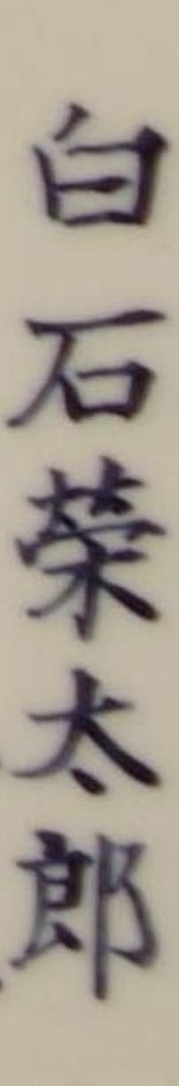白石榮太郎
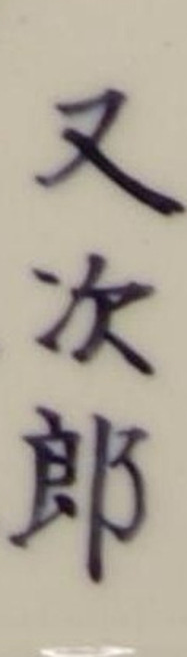又次郎
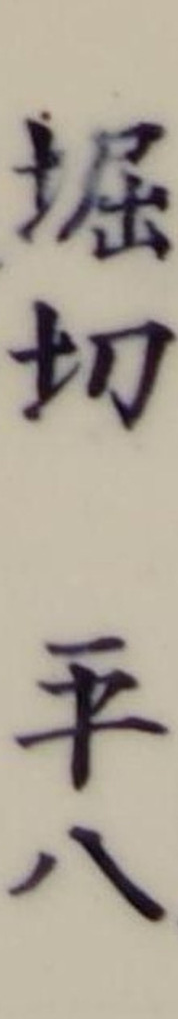堀切平八
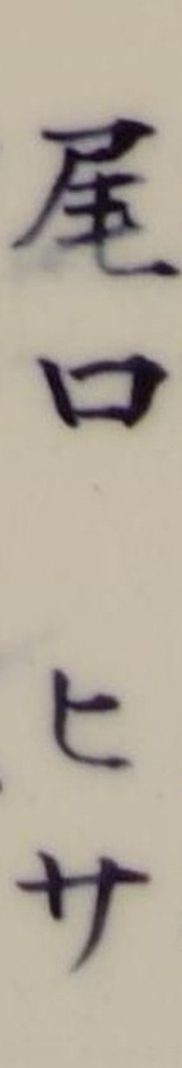尾口ヒサ
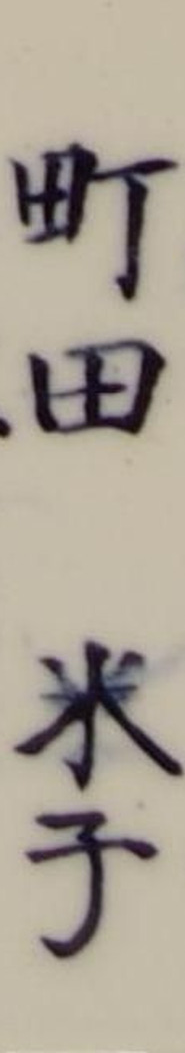町田米子
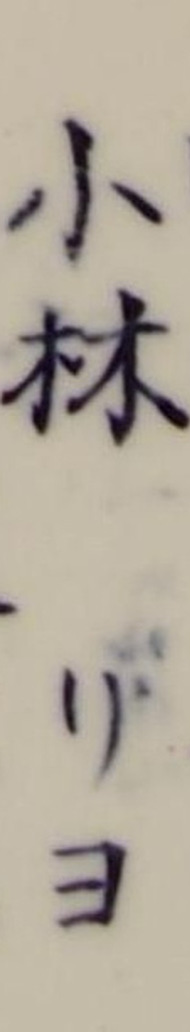小林リヨ
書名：E~L
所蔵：高野山金剛峯寺
